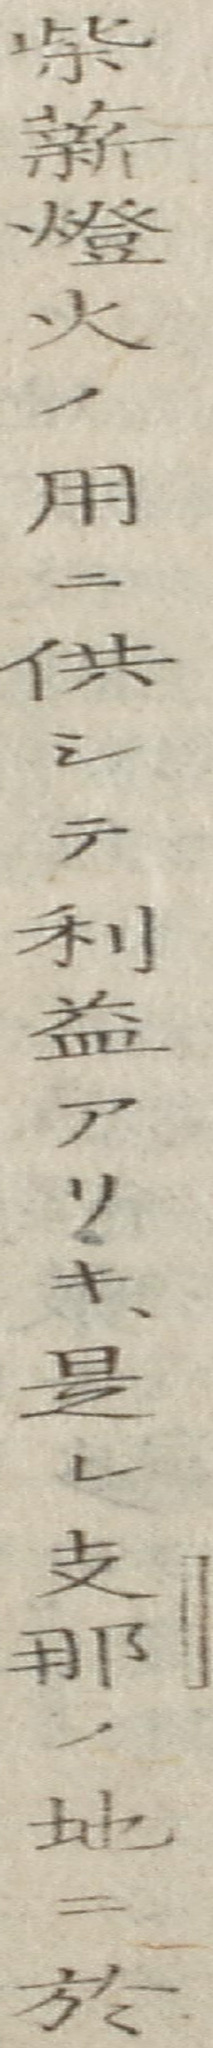柴薪燈火ノ用ニ供シテ利益アリキ、是レ支那ノ地ニ於
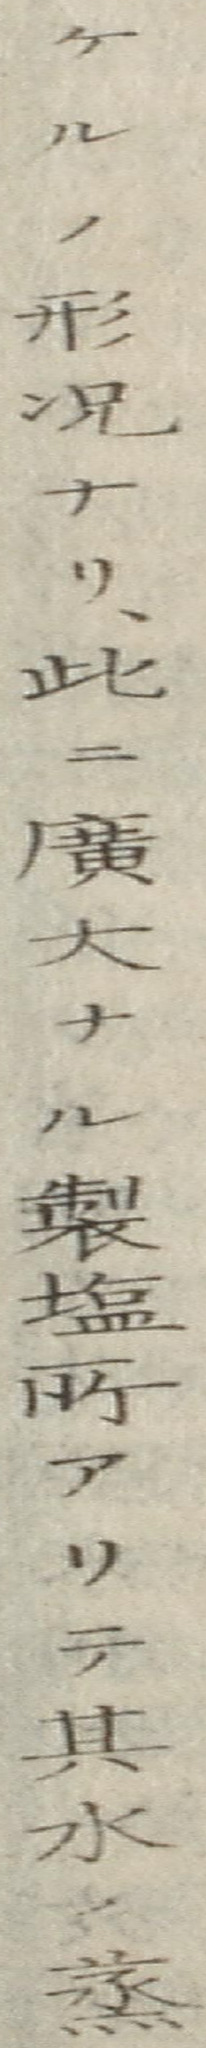ケルノ形況ナリ、此ニ広大ナル製塩所アリテ其水ノ蒸
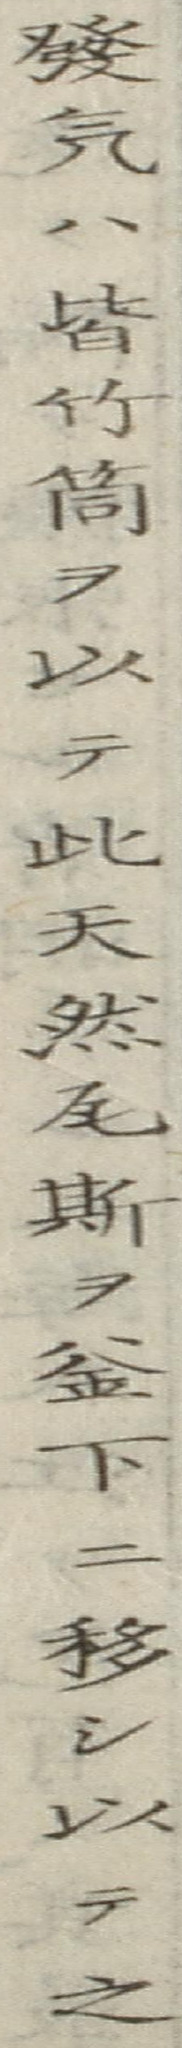発気ハ皆竹筒ヲ以テ此天然瓦斯ヲ釜下ニ移シ以テ之
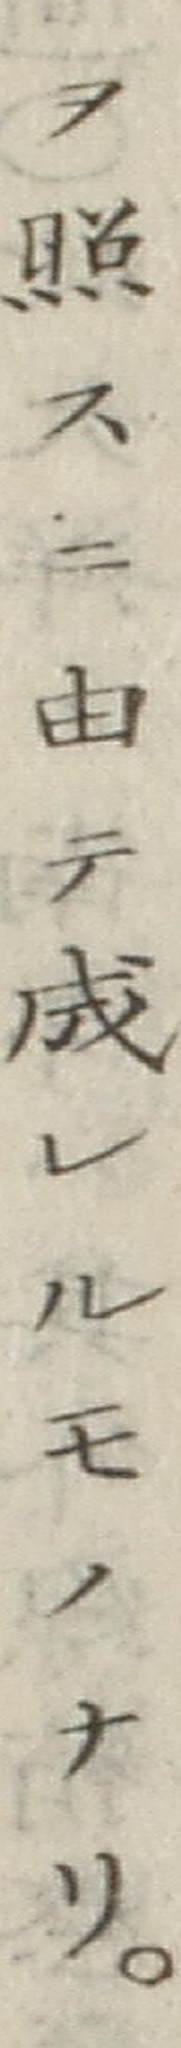ヲ照スニ由テ成レルモノナリ。
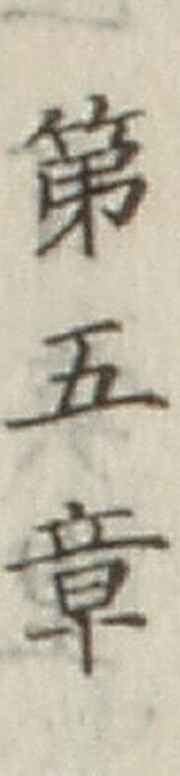第五章
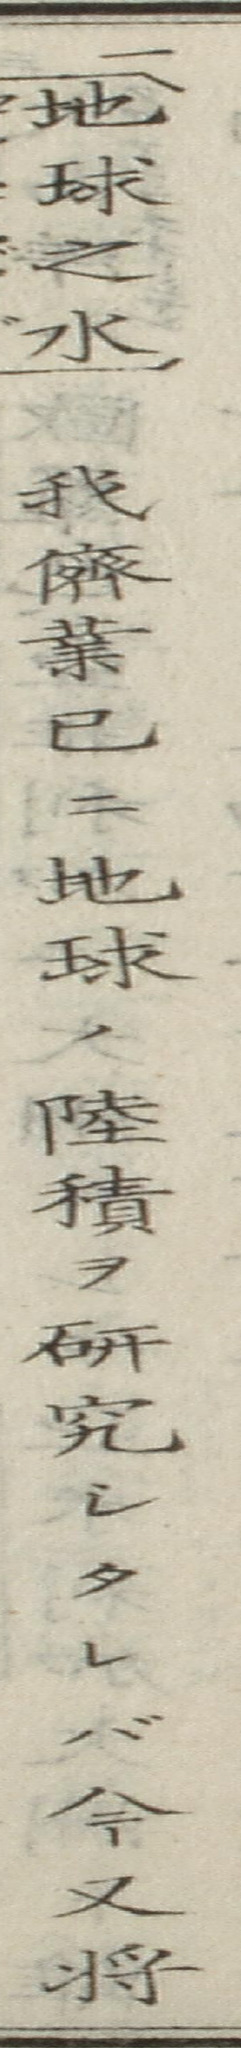一〔地球之水〕我儕業已ニ地球ノ陸積ヲ研究シタレバ今又将
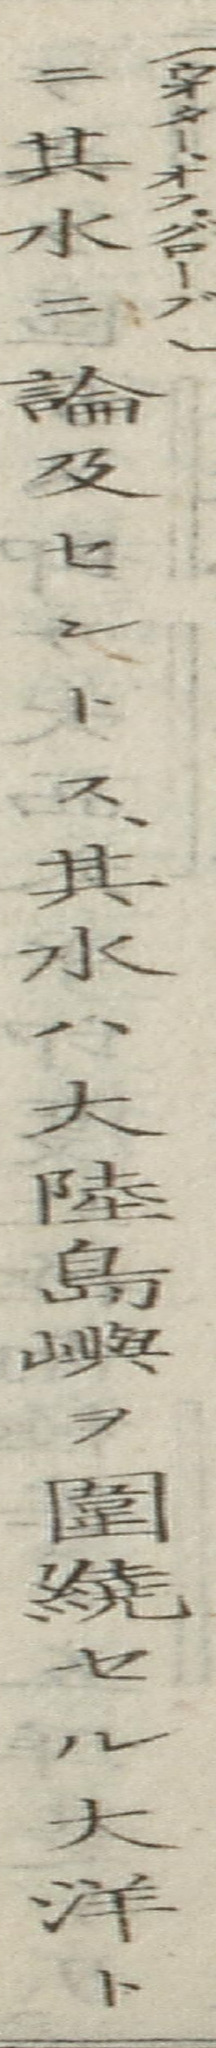ニ其水ニ論及セントス、其水ハ大陸島嶼ヲ囲繞セル大洋ト
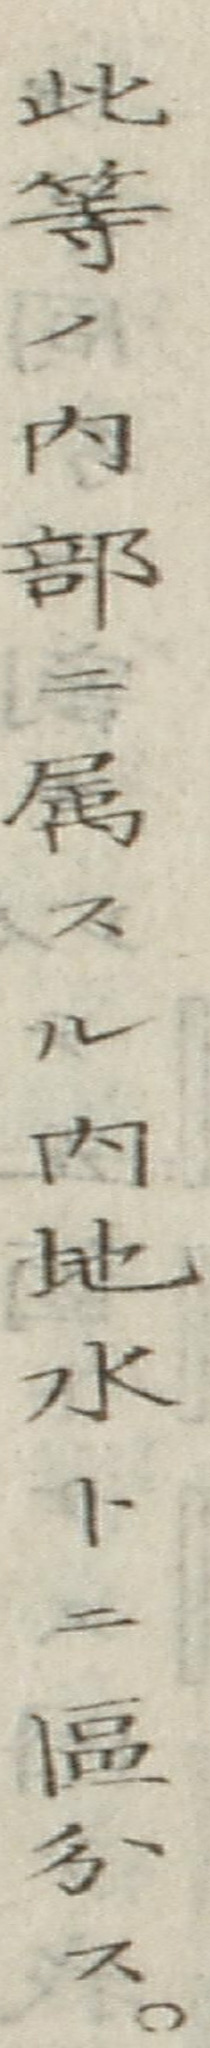此等ノ内部ニ属スル内地水トニ区分ス。
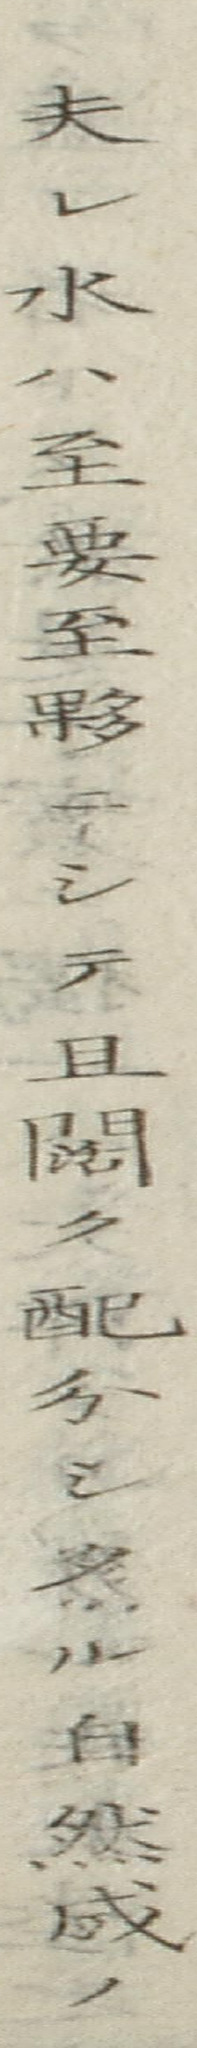夫レ水ハ至要至夥ニシテ且闊ク配分シタル自然成ノ
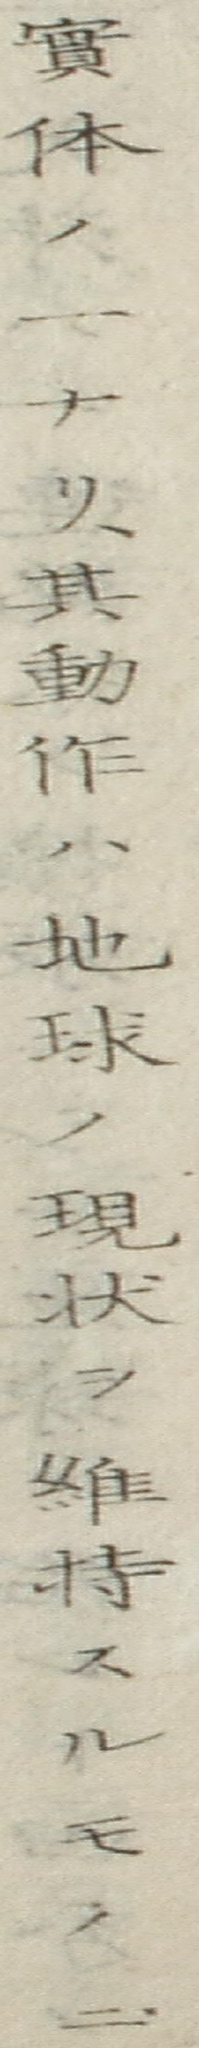実体ノ一ナリ、其動作ハ地球ノ現状ヲ維持スルモノニ
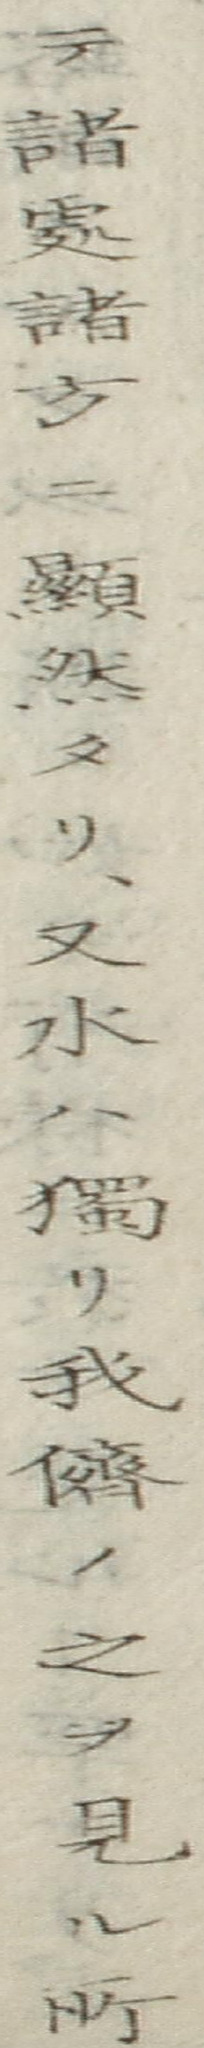テ諸処諸方ニ顕然タリ、又水ハ獨リ我儕ノ之ヲ見ル所
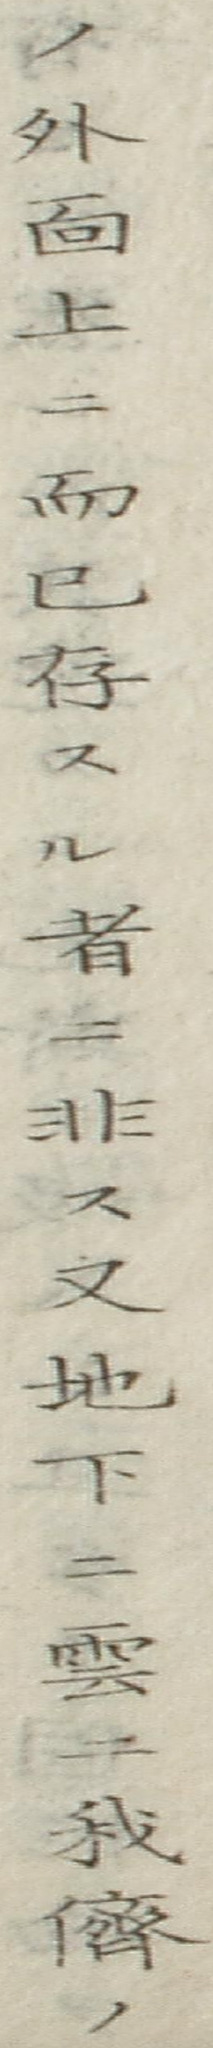ノ外面上ニ而已存スル者ニ非ス又地下ニ雲ニ我儕ノ
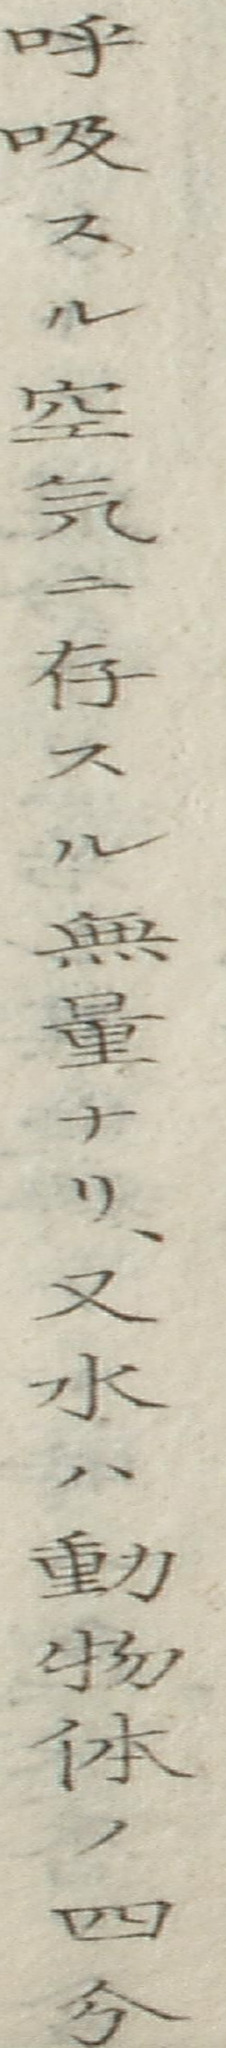呼吸スル空気ニ存スル無量ナリ、又水ハ動物体ノ四分
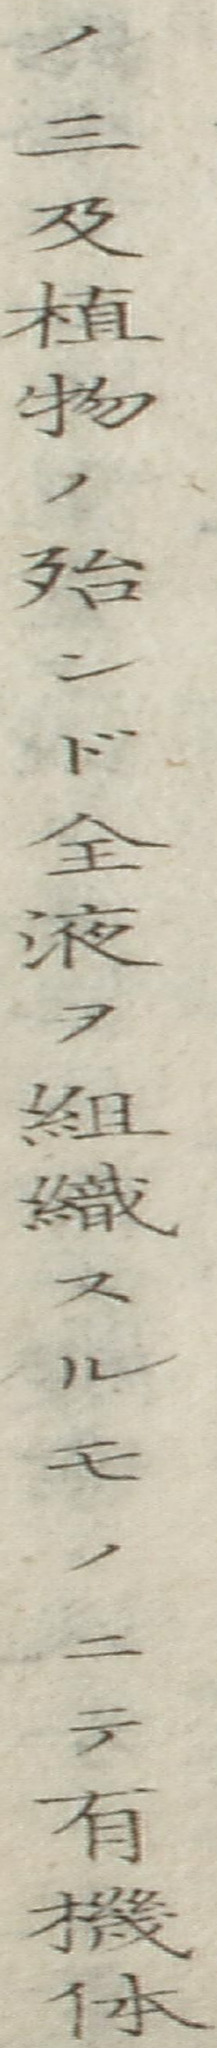ノ三及植物ノ殆ンド全液ヲ組織スルモノニテ有機体
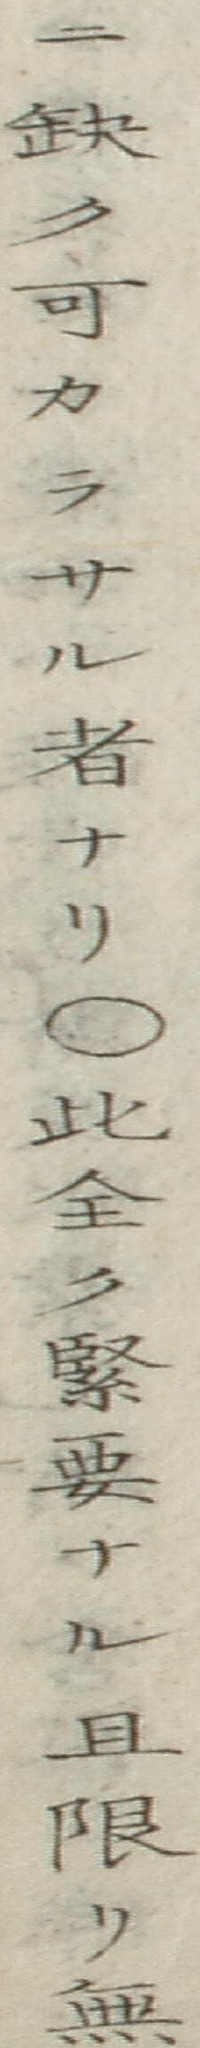ニ缺ク可カラサル者ナリ○此全ク緊要ナル且限リ無

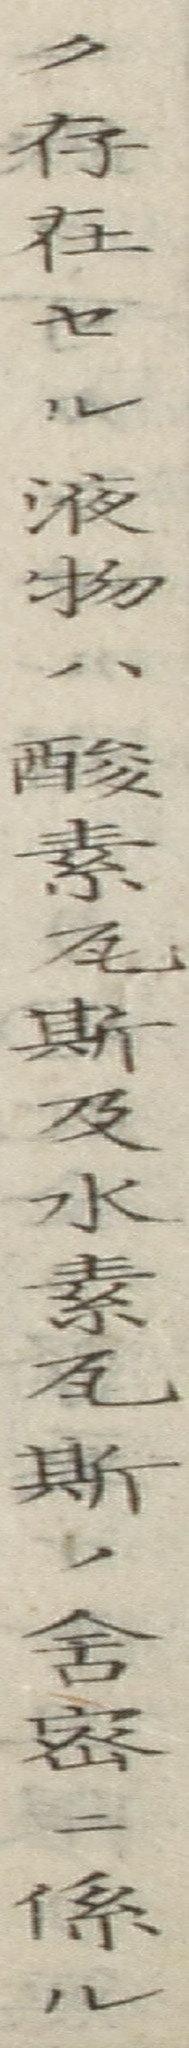ク存在セル液物ハ酸素瓦斯及水素瓦斯ノ舎密ニ係ル
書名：地形論　巻二
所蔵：東京大学地震研究所図書室 Earthquake Research Institute Library, The University of Tokyo, JAPAN
